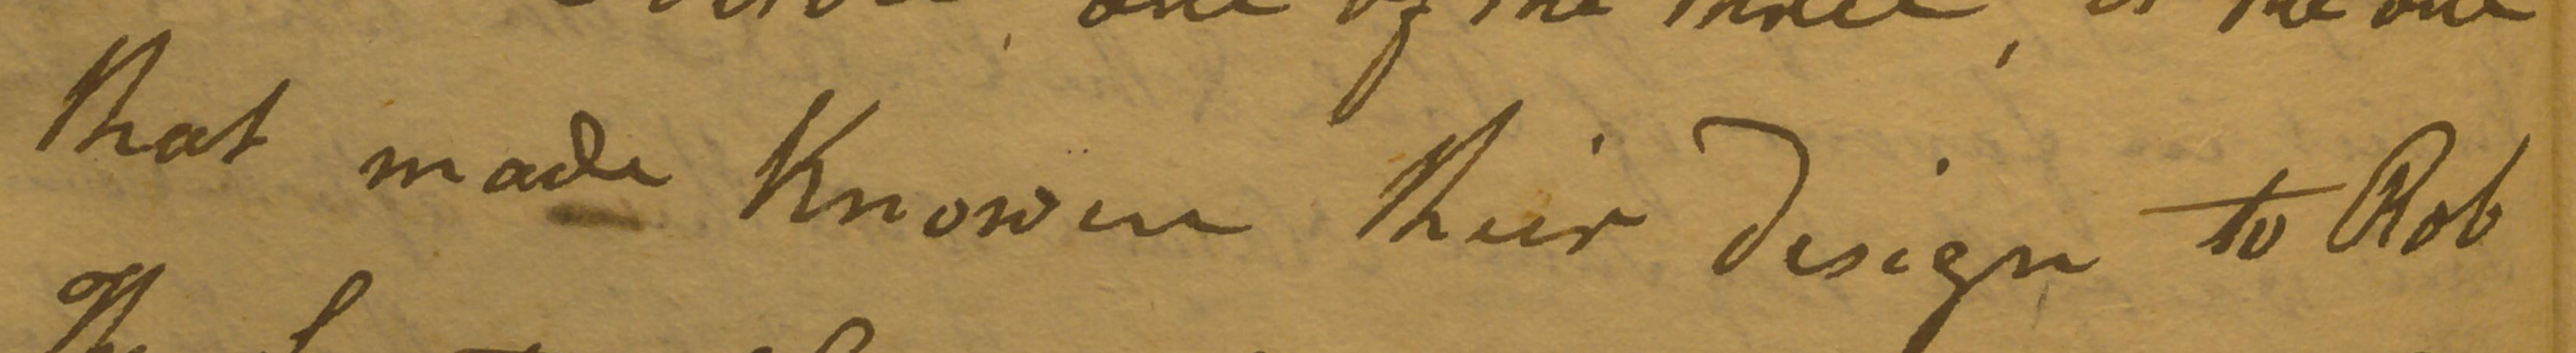that made knowen their design to Rob
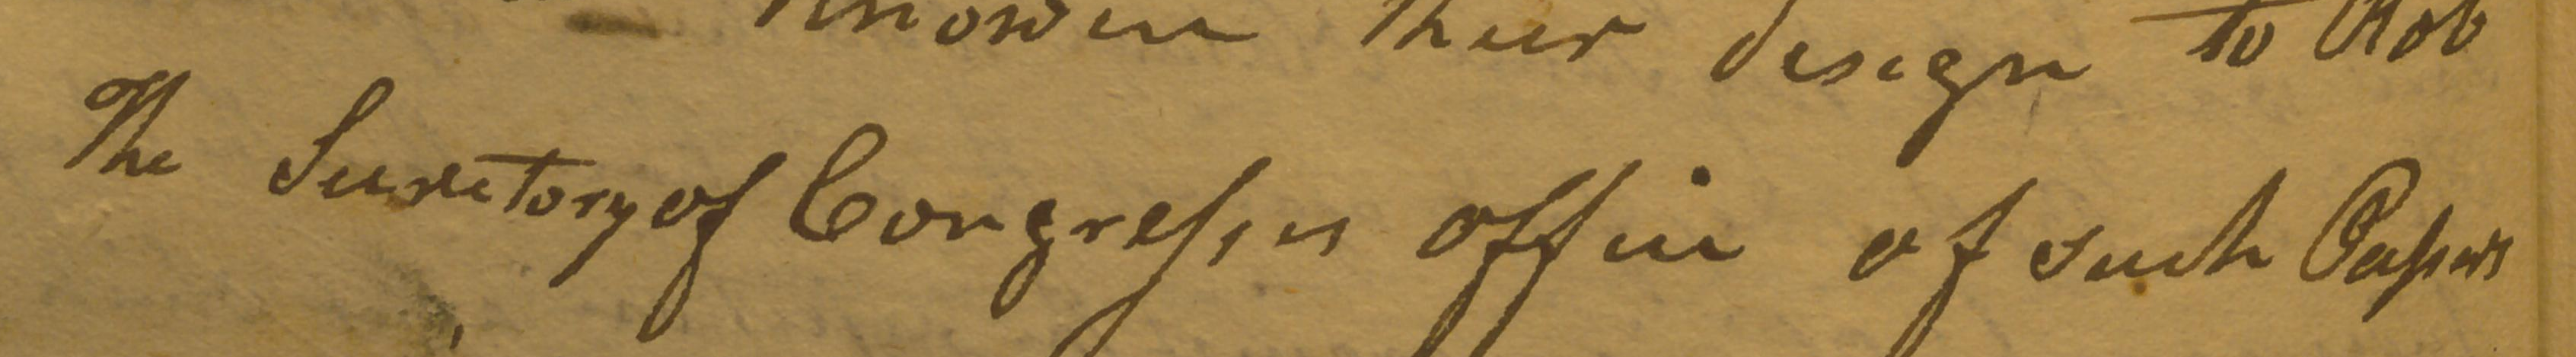The Secretory of Congresses office of such Papers
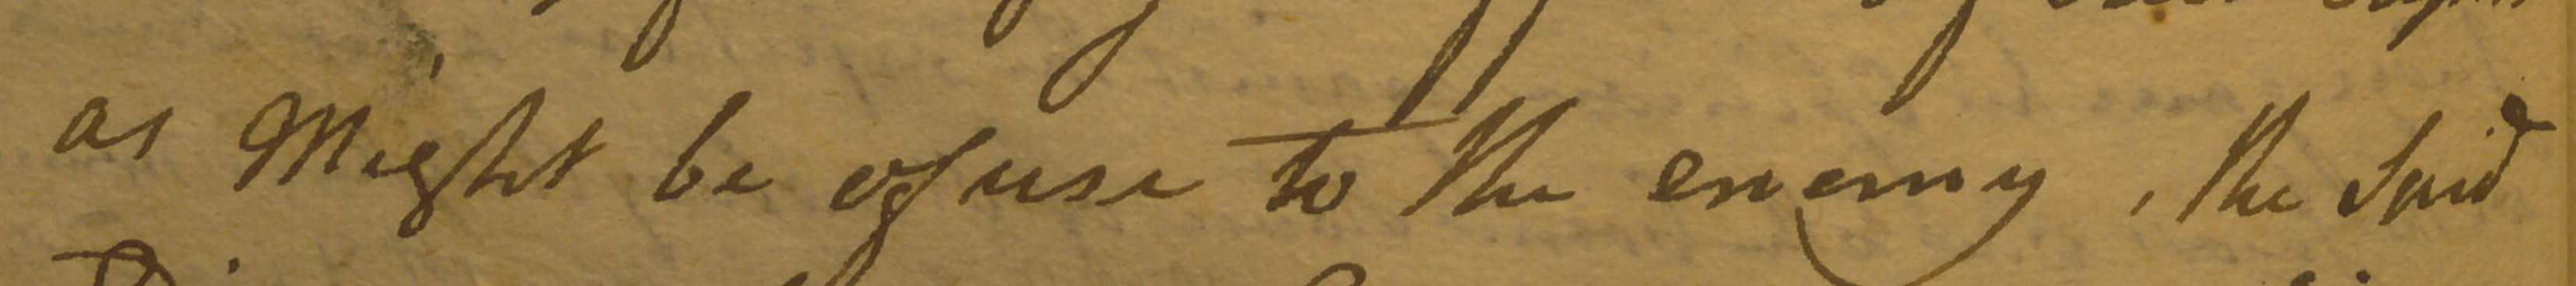as Might be of use to the enemy, the Said
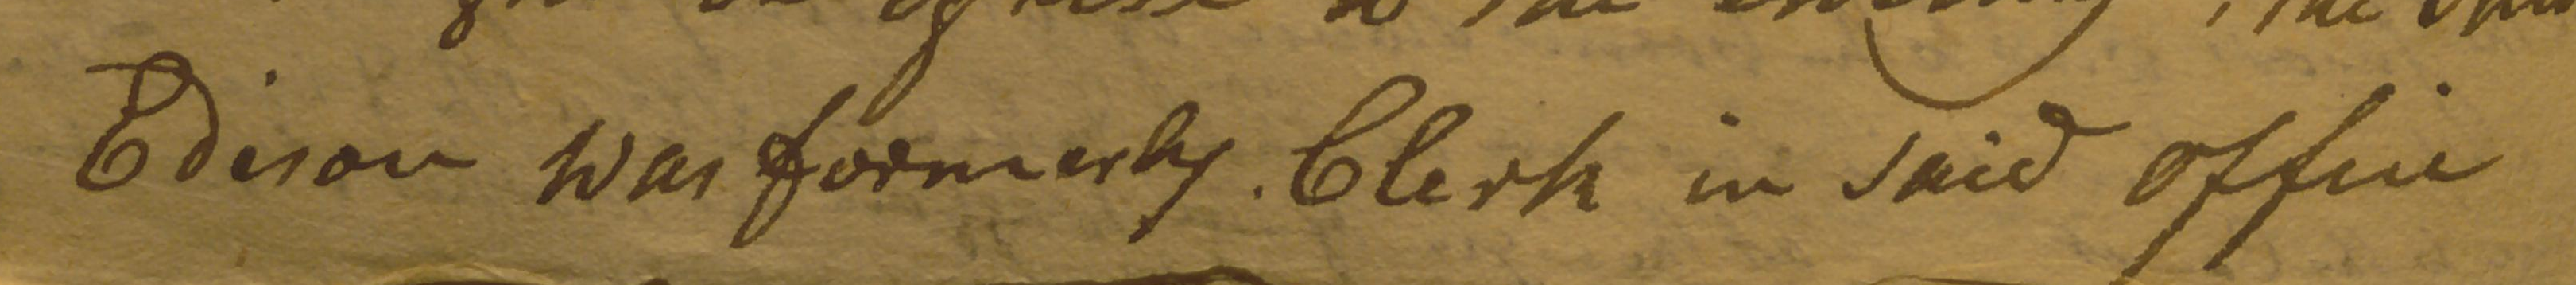Edison was formerly Clerk in said office
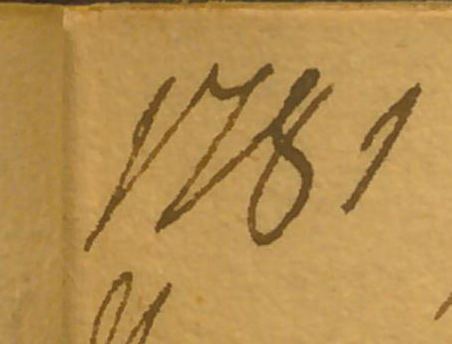1781
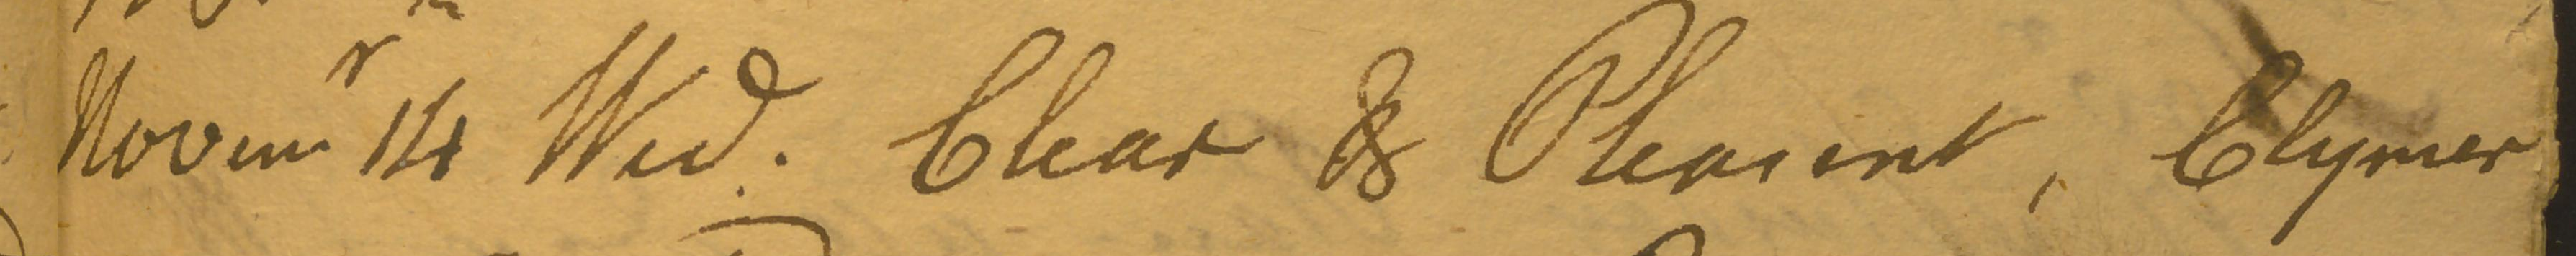Novem^r 14 Wed. Clear & Pleasent, Clymer
